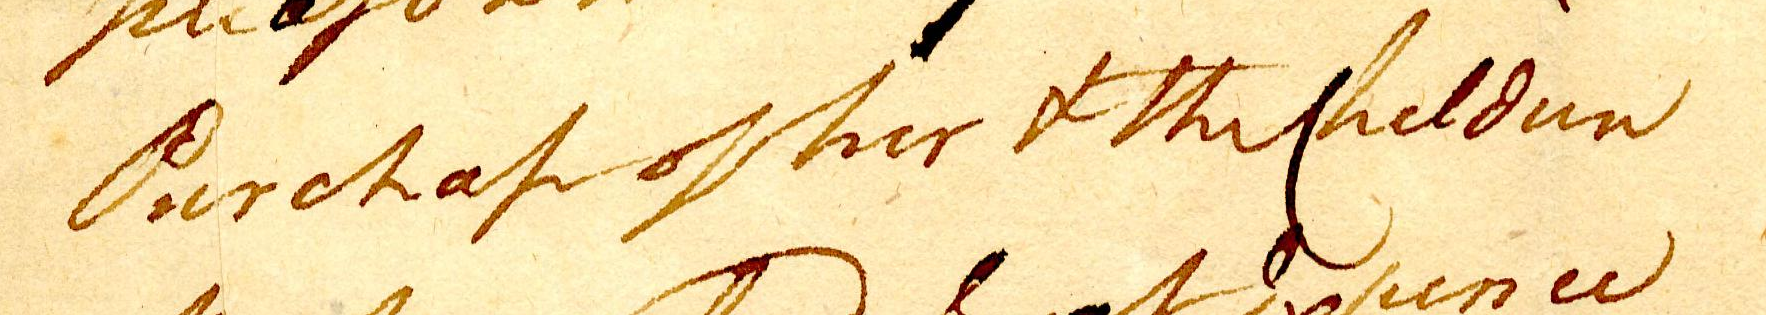Purchase of her & the Children
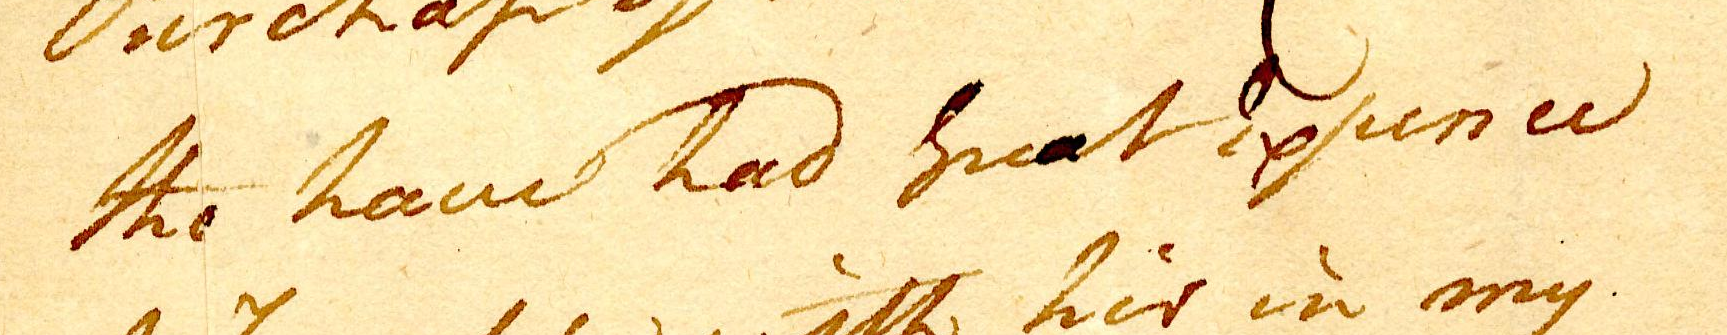tho have had Great expence
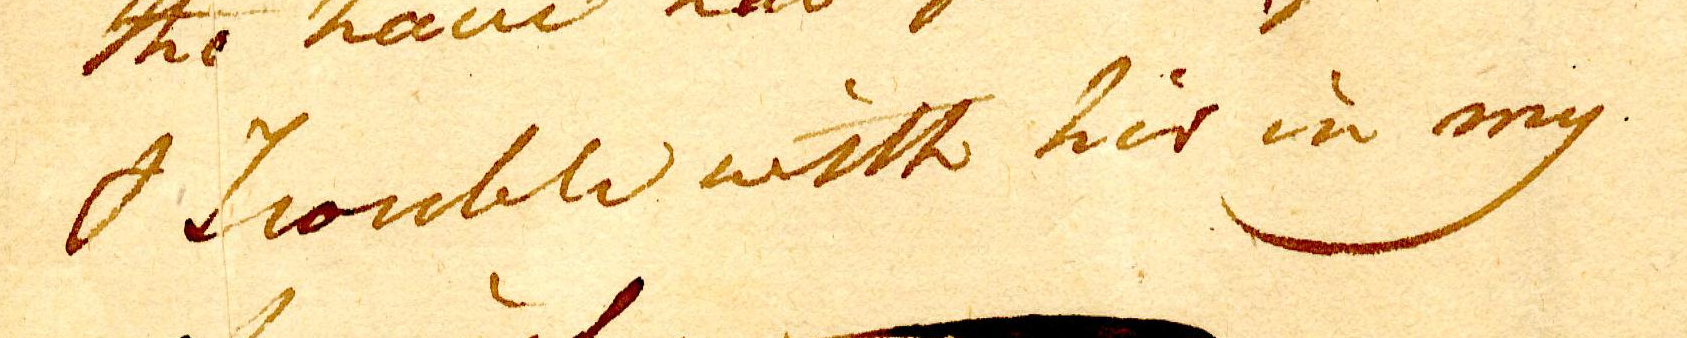& trouble with her in my
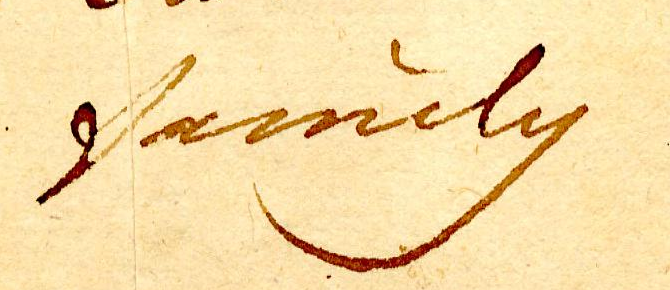family
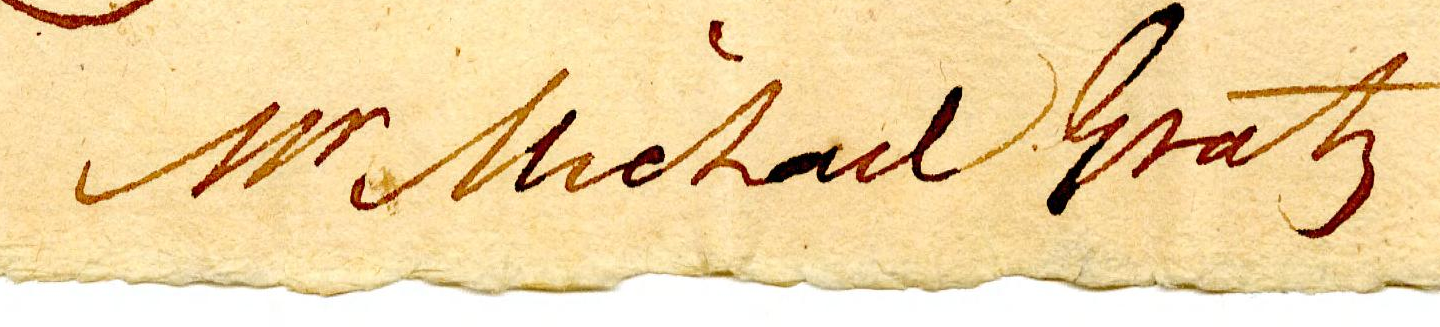M^r. Michael Gratz
